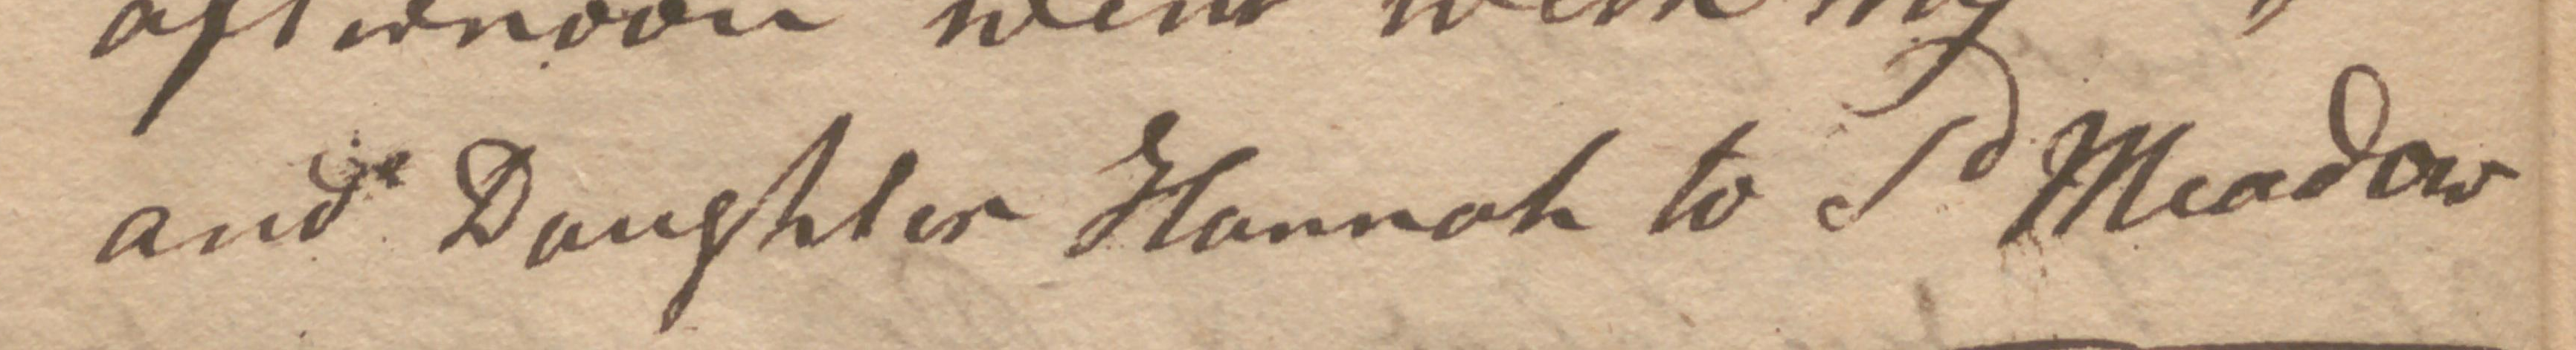and Daughter Hannah to s^d. Meadow
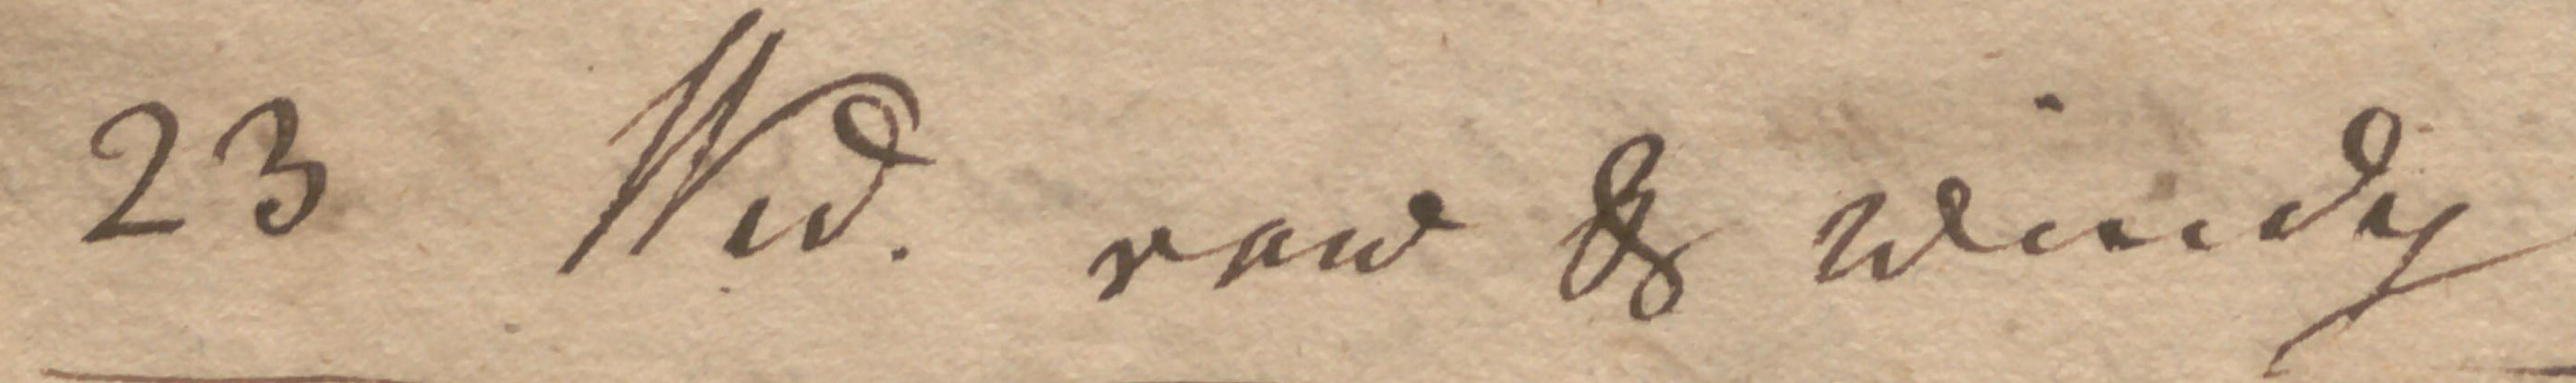23 Wed. raw & windy
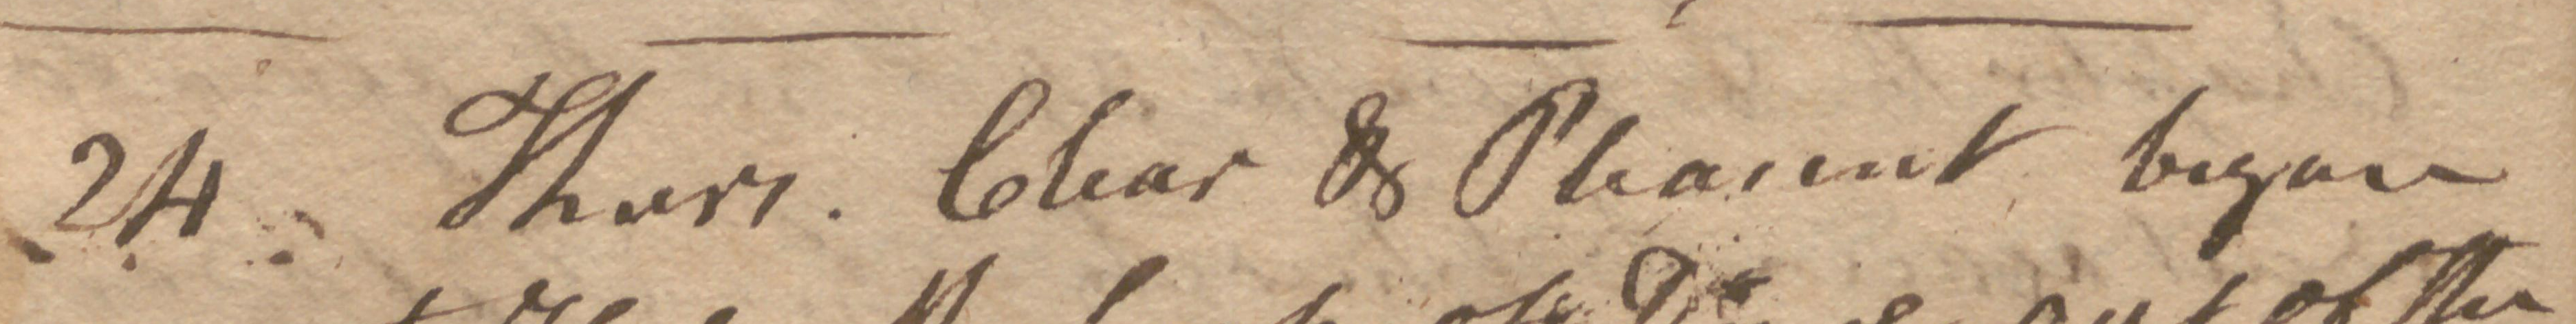24. Thurs. Clear & Pleasent began
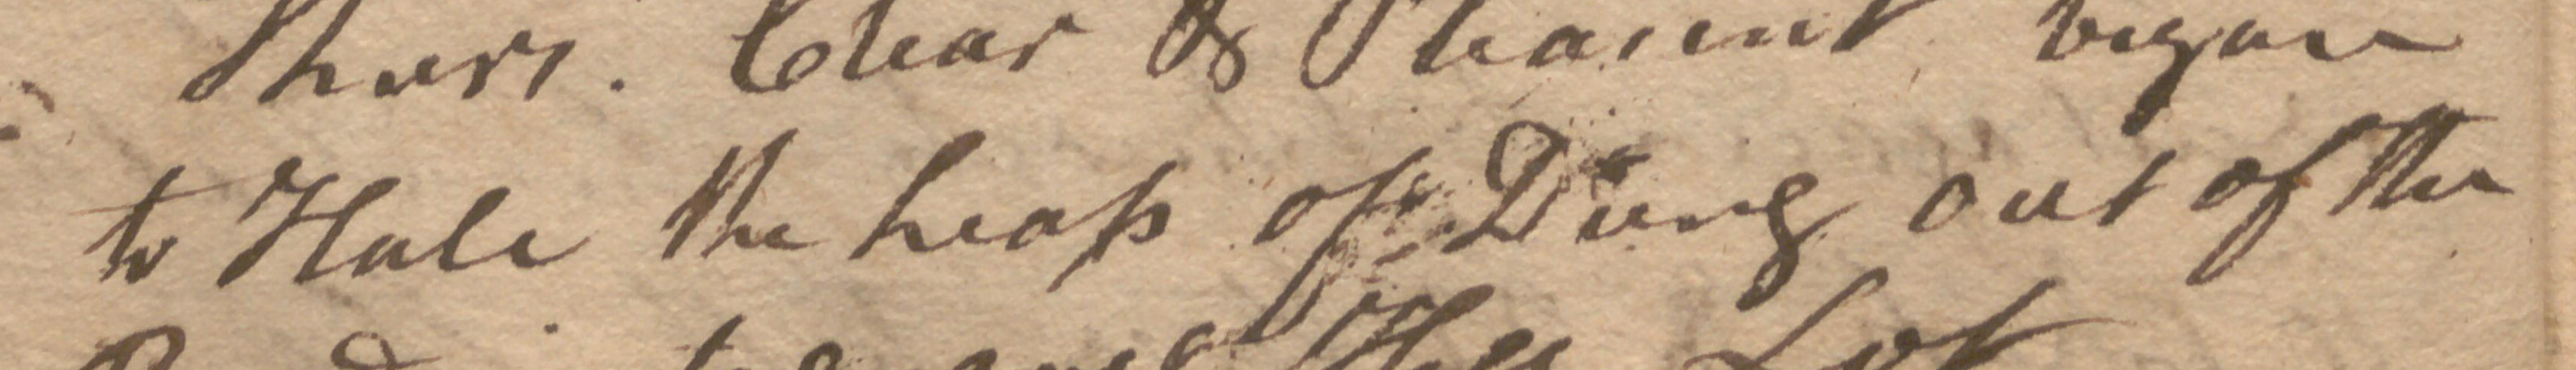to Hale the heap of Deng out of the
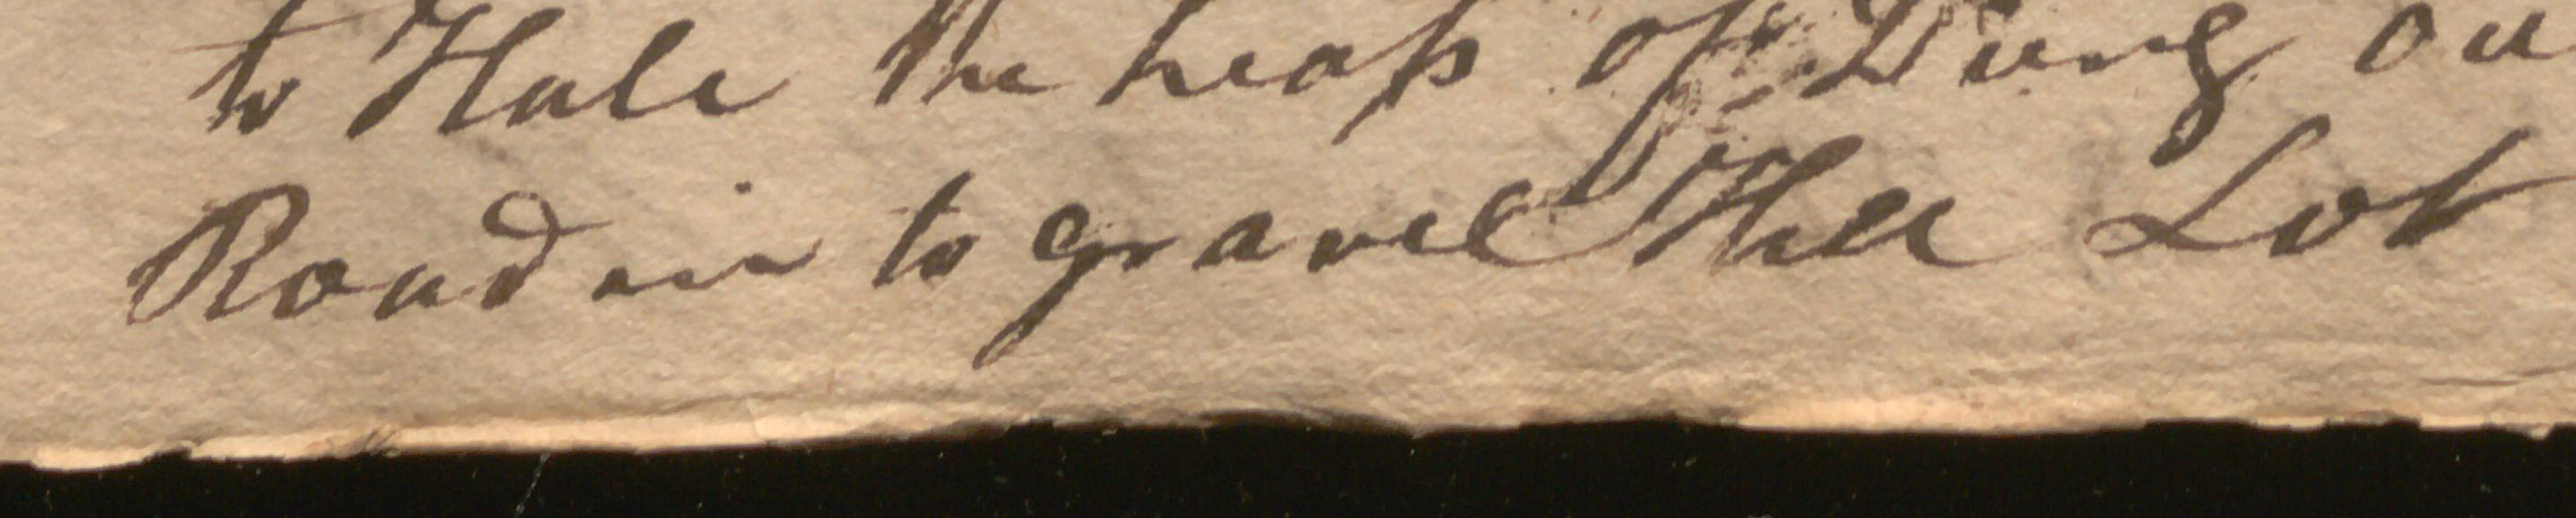Road in to gravel Hill Lot
